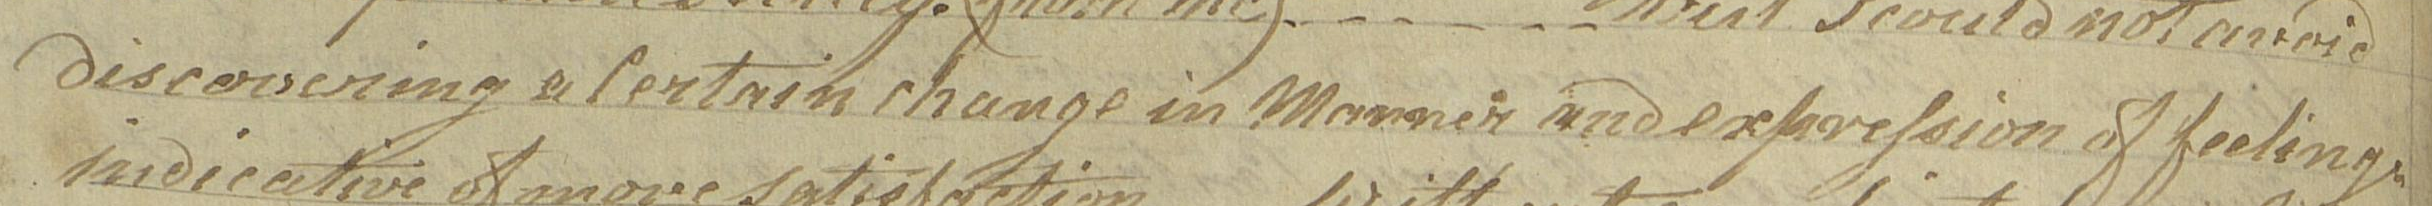discovering a Certain change in Manner and expression of feeling
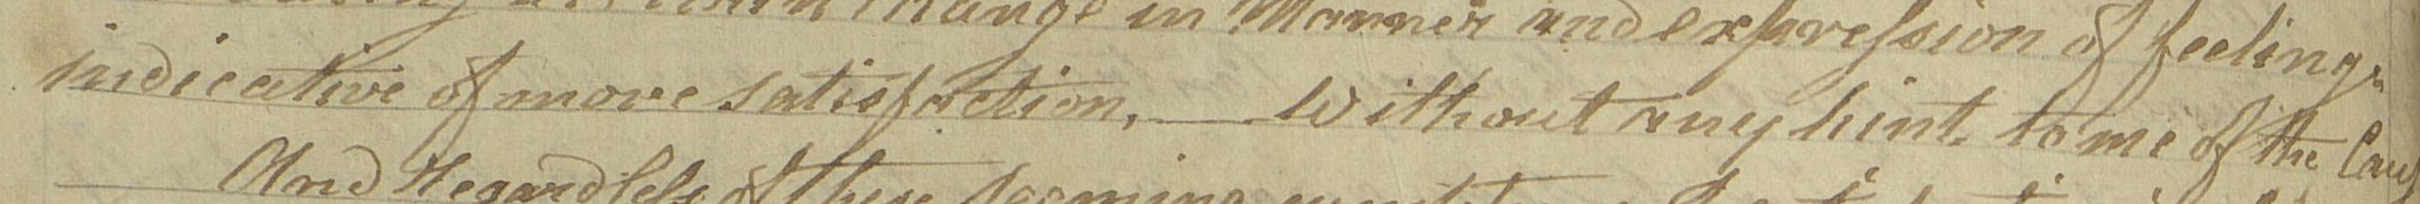indicative of more satisfaction. Without any hint to me of the Cause
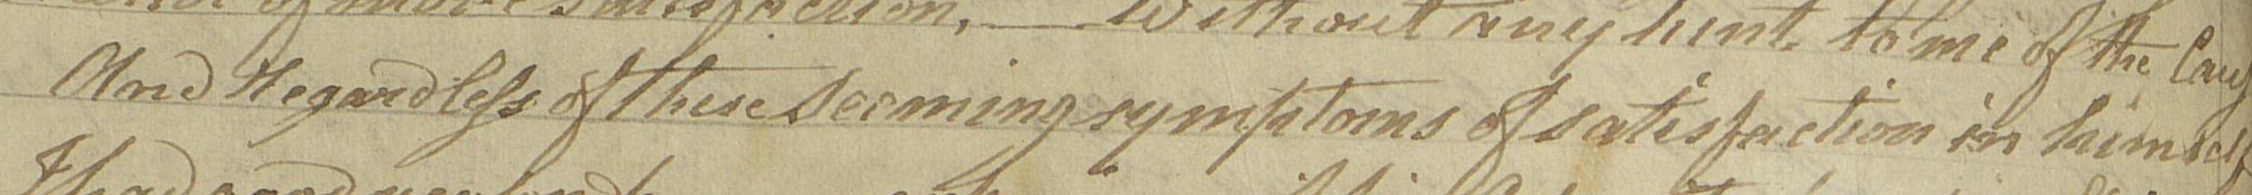And regardless of these Seeming symptoms of satisfaction in himself
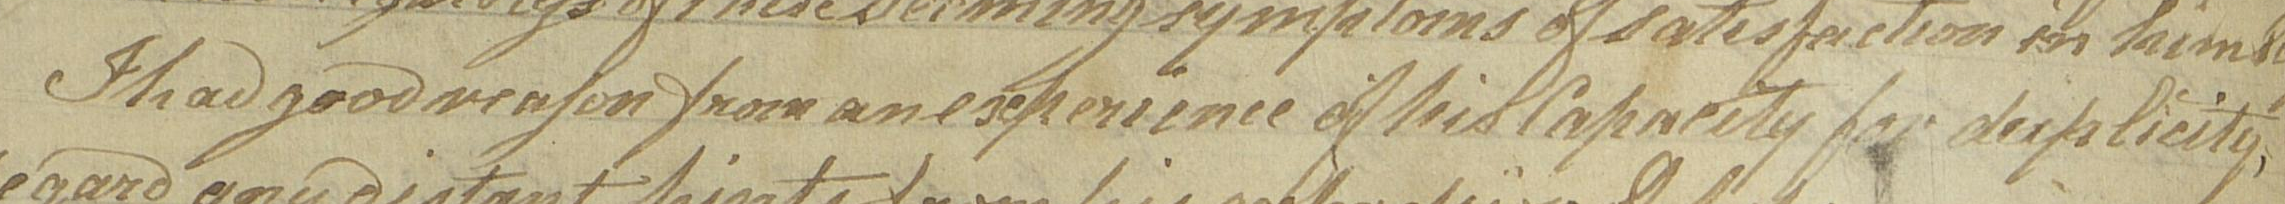I had good reason from an experience of his Capacity for duplicity, to
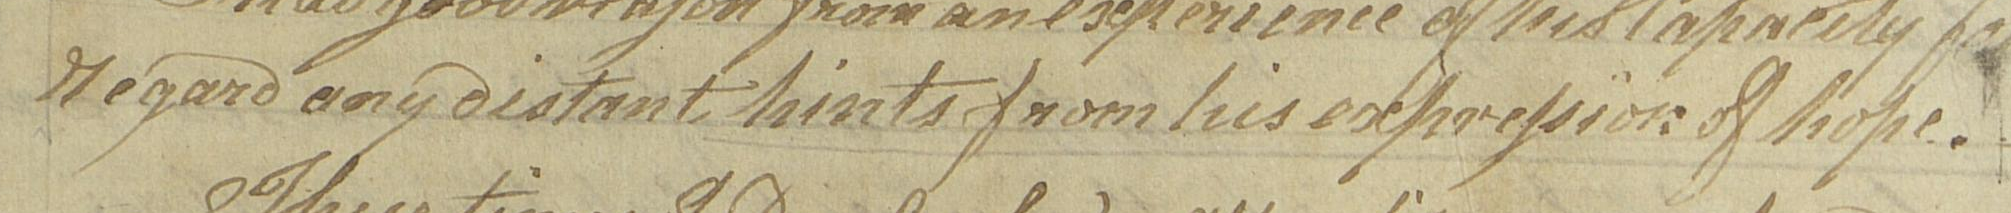regard any distant hints from his expression of hope.
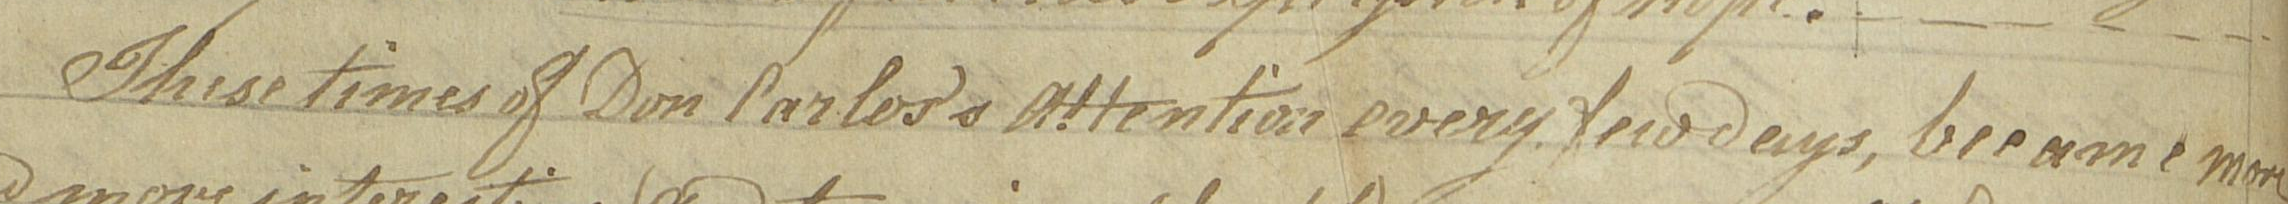These times of Don Carlos's Attention every few days, became more
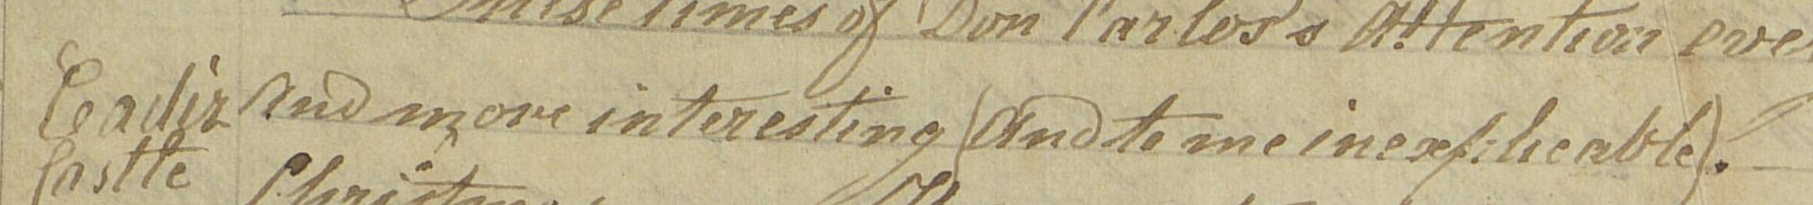Cadiz and more interesting (and to me inexplicable).
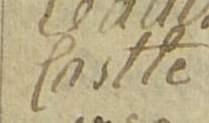Castle
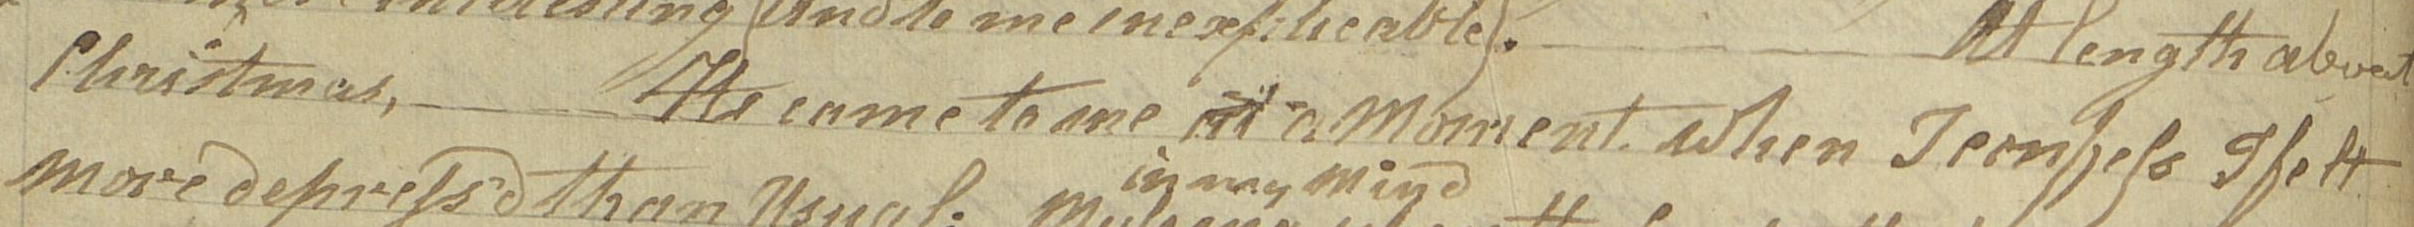Christmas, He came to me at a Moment when I confess I left
